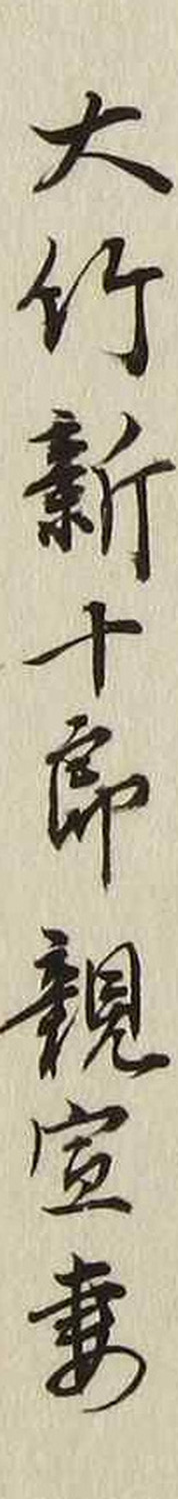女大竹新十郎親宣妻
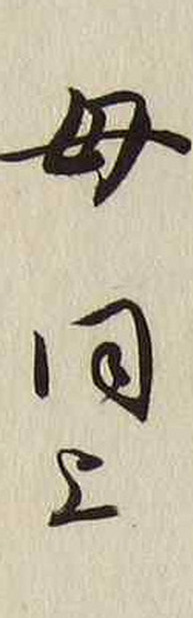母同上

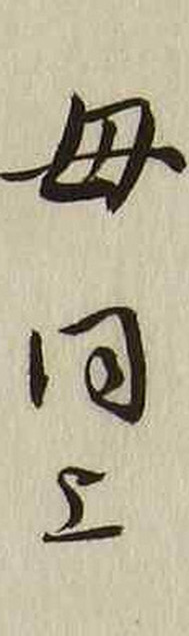母同上
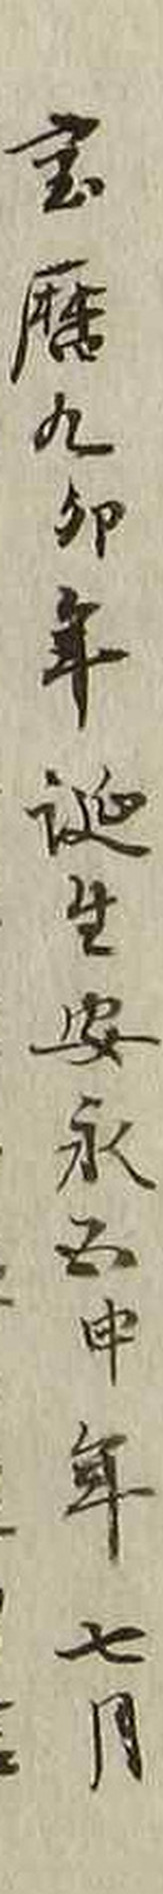宝暦九卯年誕生安永五申年七月
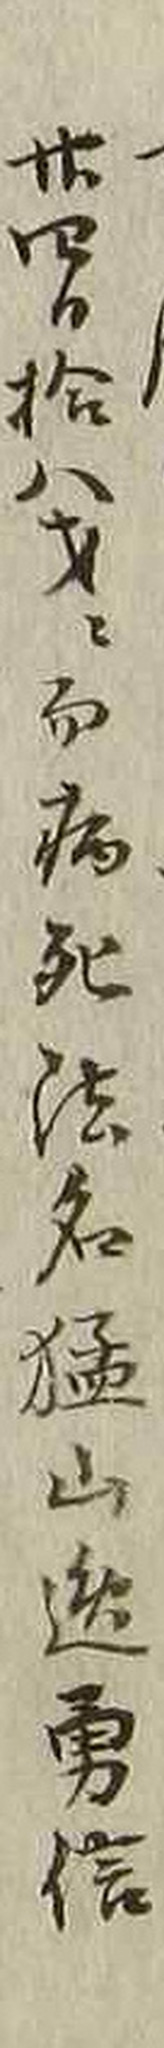吉次郎廿四拾八才ニて病死法名猛山逸勇信
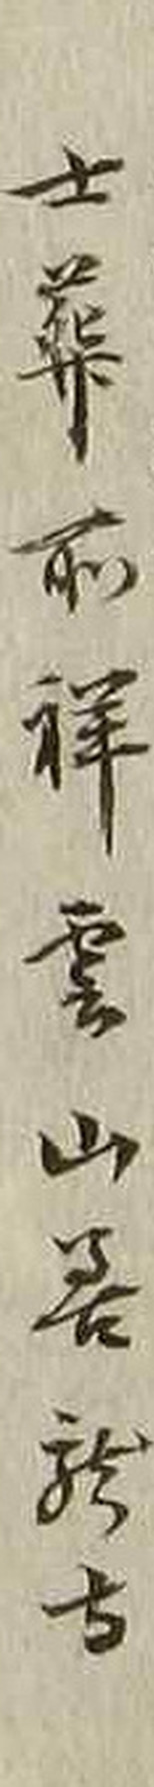士葬所祥雲山善龍寺
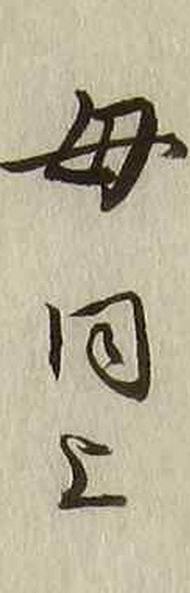母同上
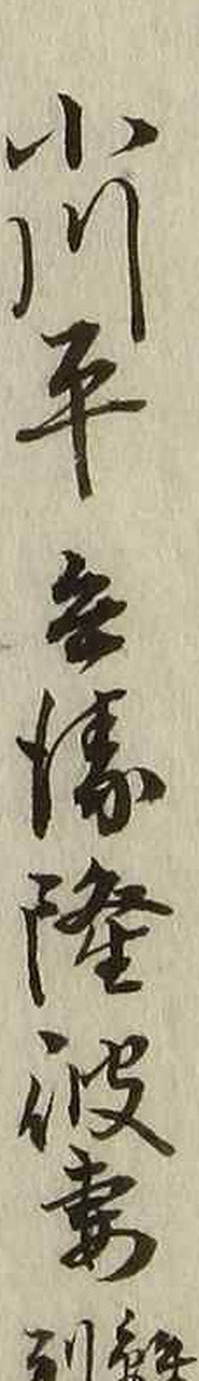小川平兵衛隆彼妻離別
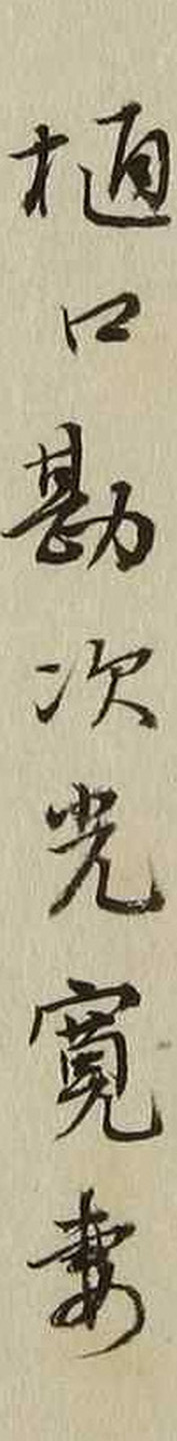樋口勘次光寛妻
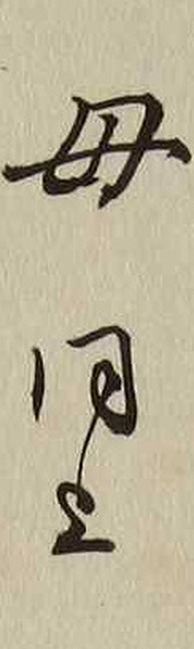母同上
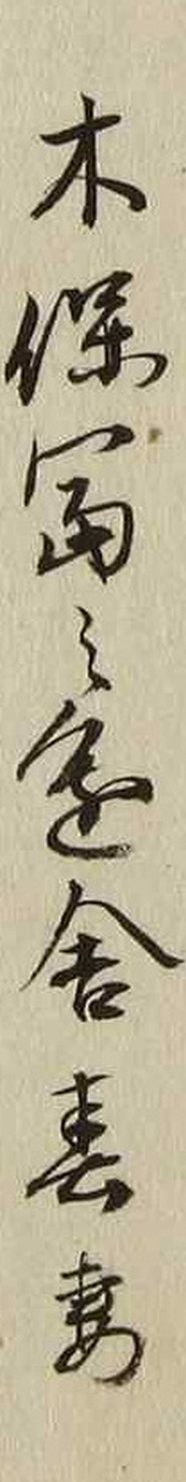女木保冨之進舎春妻
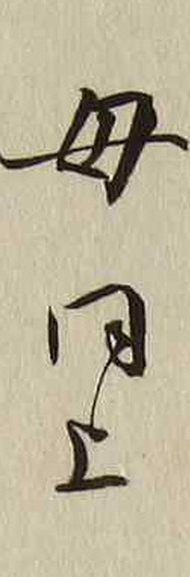母同上
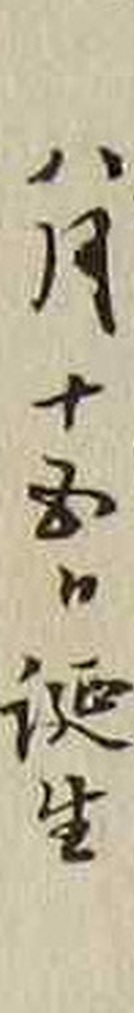八月十五日誕生
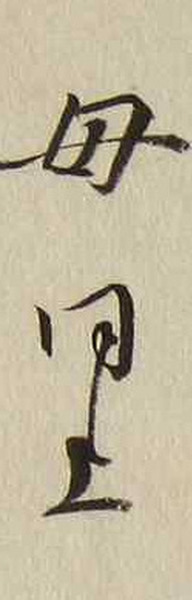母同上

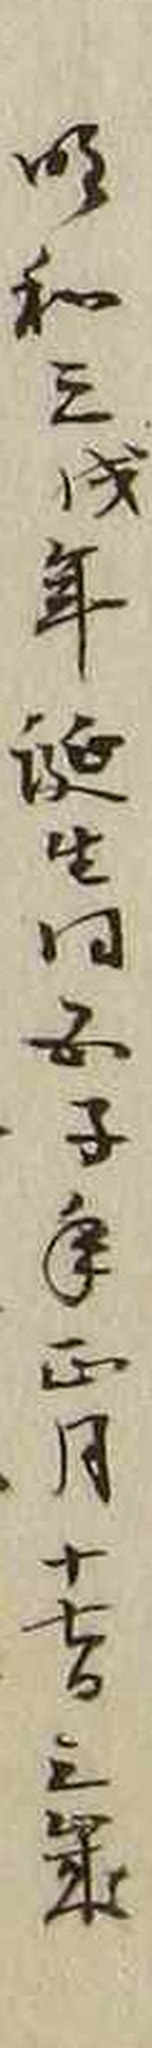明和三戌年誕生同五子年正月十七日三歳
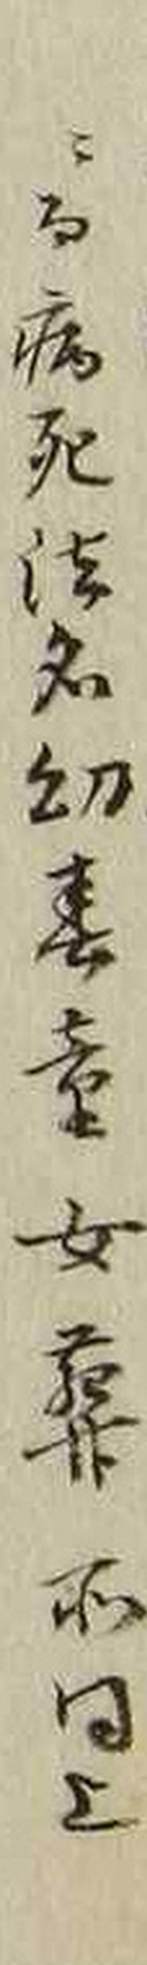女ニて病死法名幼春童女葬所同上
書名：諸士系譜　巻之16　い之部16
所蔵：会津若松市立会津図書館
